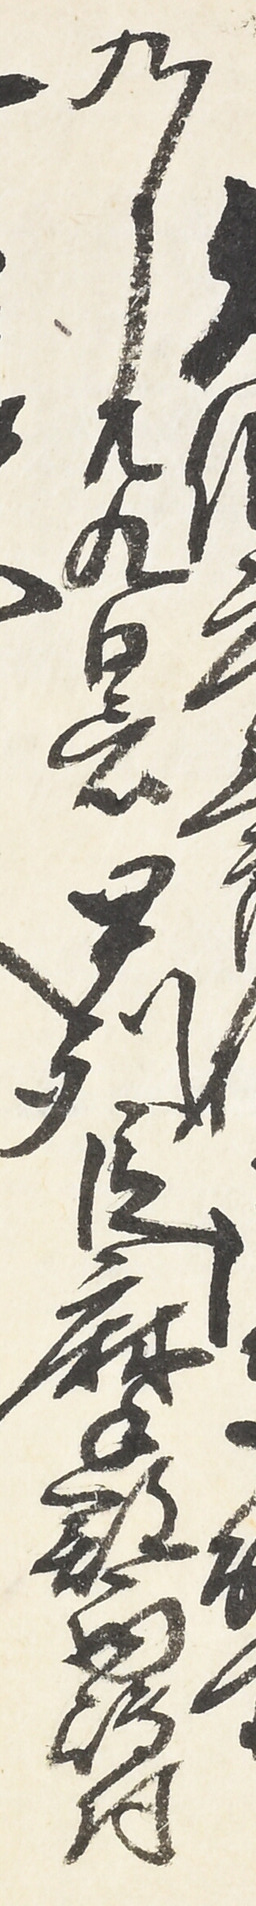九月廿九日着甲州巨摩郡西嶋村
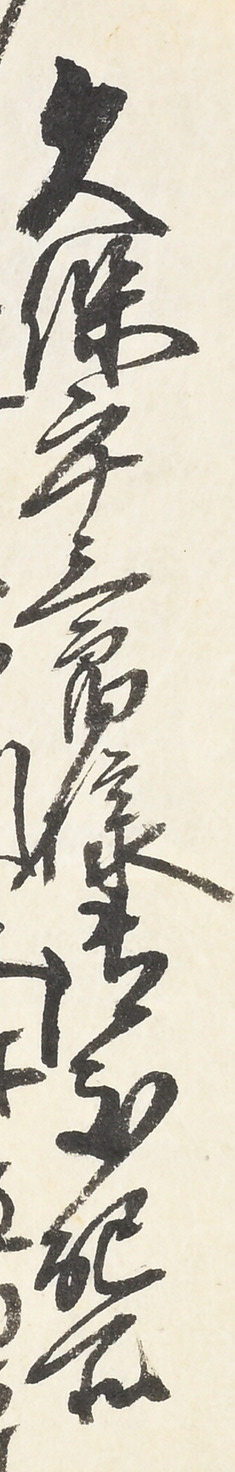久保平三郎様御支配所
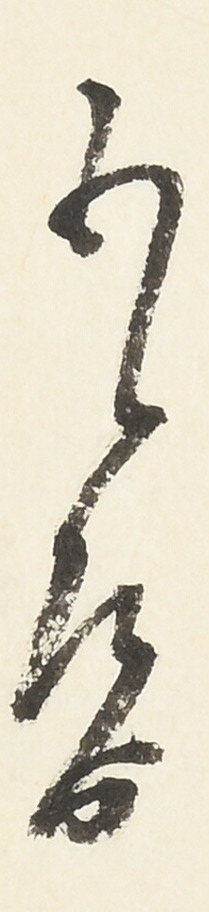五郎左衛門
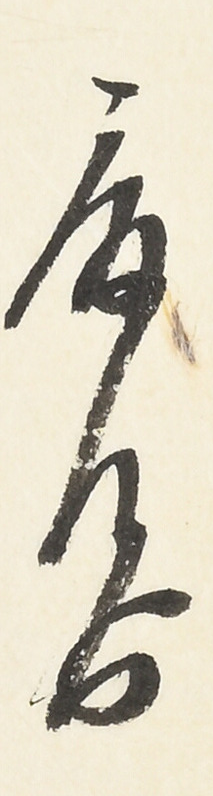藤左衛門
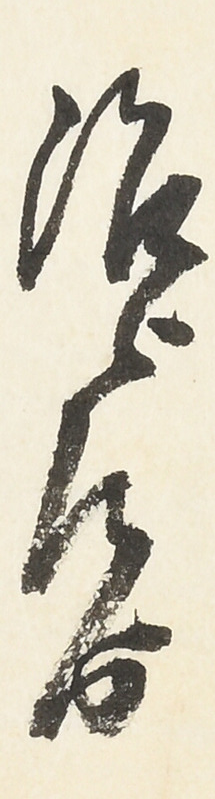治郎左衛門
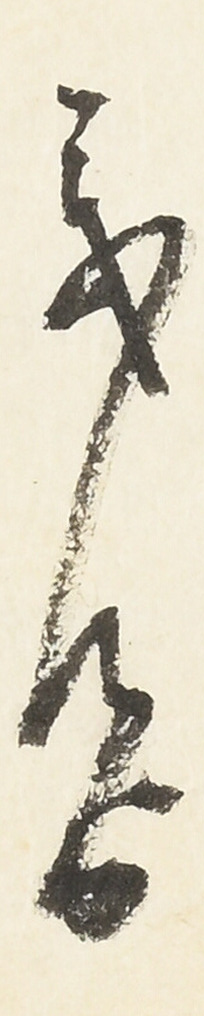義左衛門
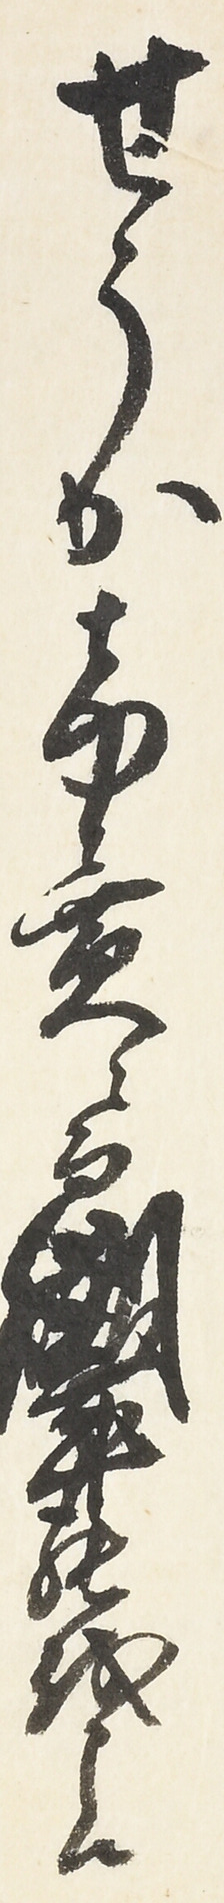せうか商売ニ而例年罷越申候
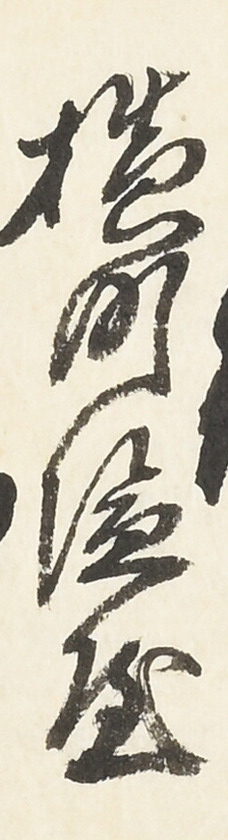横町塩屋
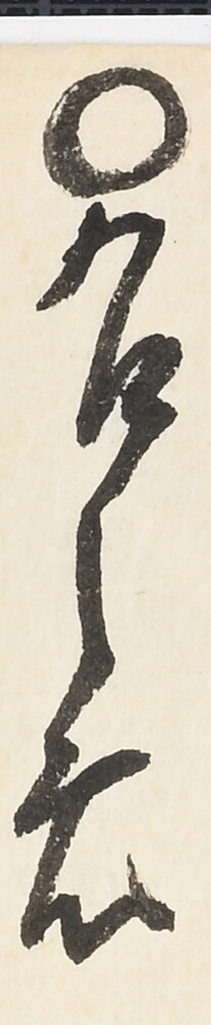〇右之者
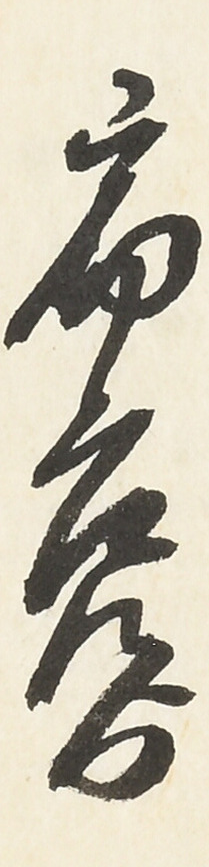宿善左衛門
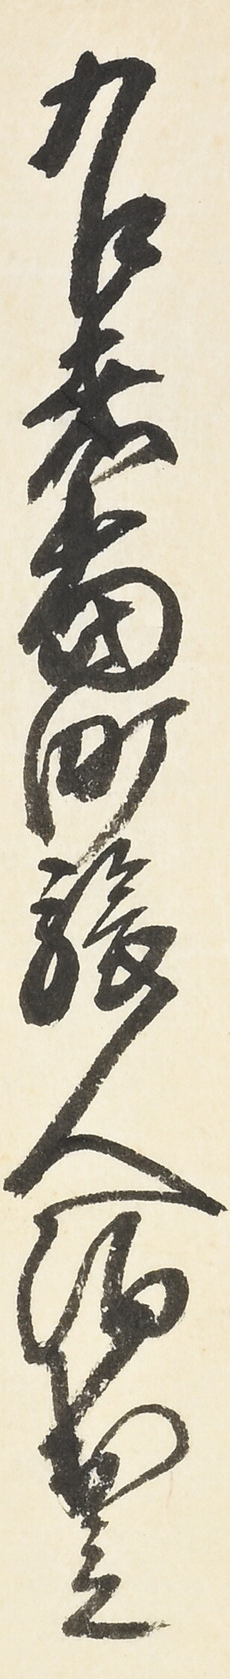右者当町旅人泊出立
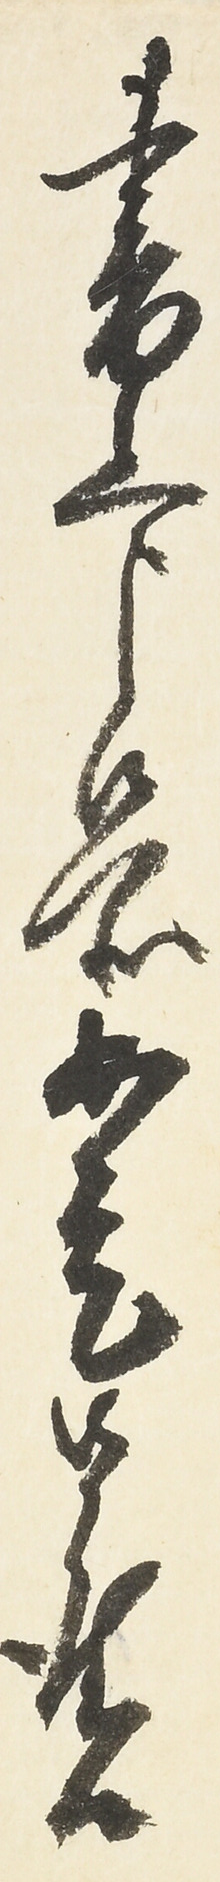書上申候所如是御座候
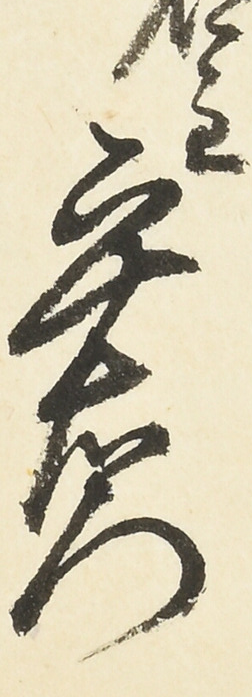平右衛門
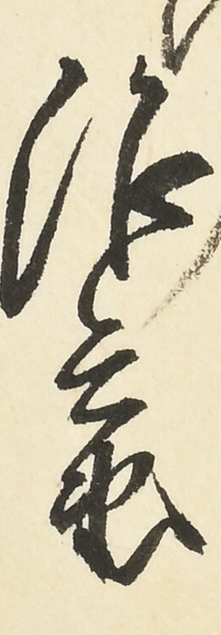治兵衛
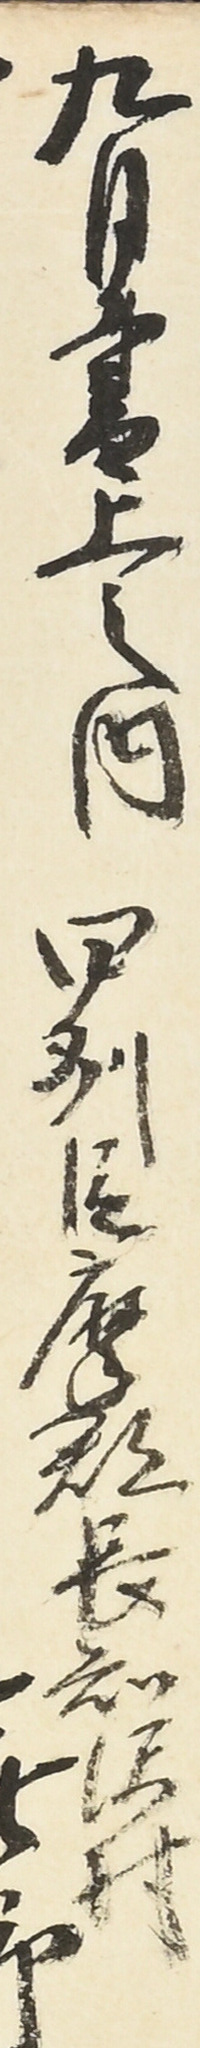九月書上之内甲州巨摩郡長知沢村
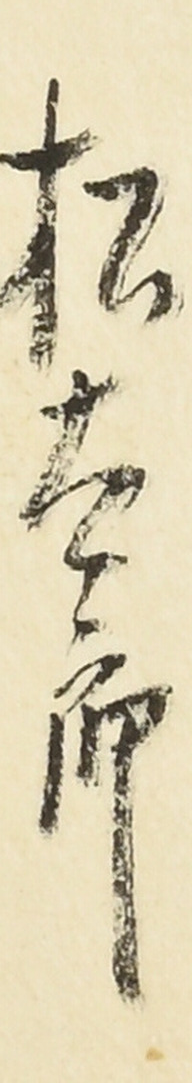松太郎
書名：町中旅人泊控帳
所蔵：伊那市立高遠町図書館・合同会社AMANE
